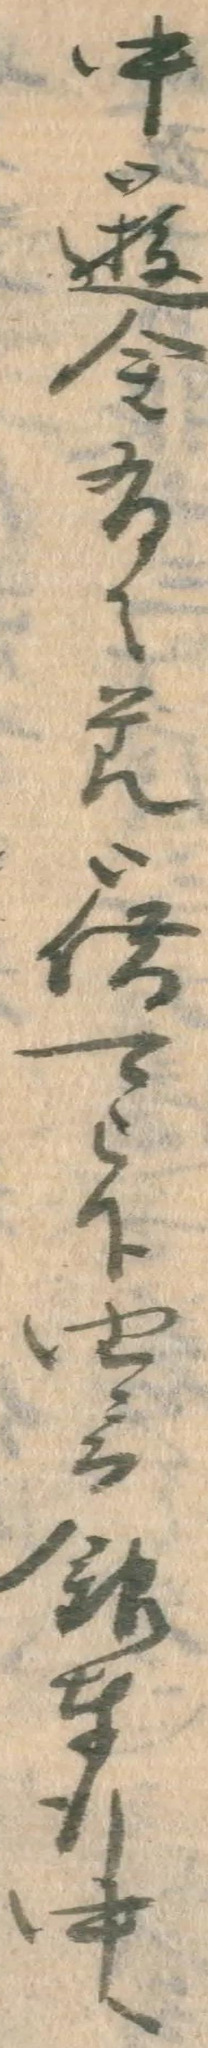中御遊金有之節、御借可被下由ニ而、銀奉行中へ
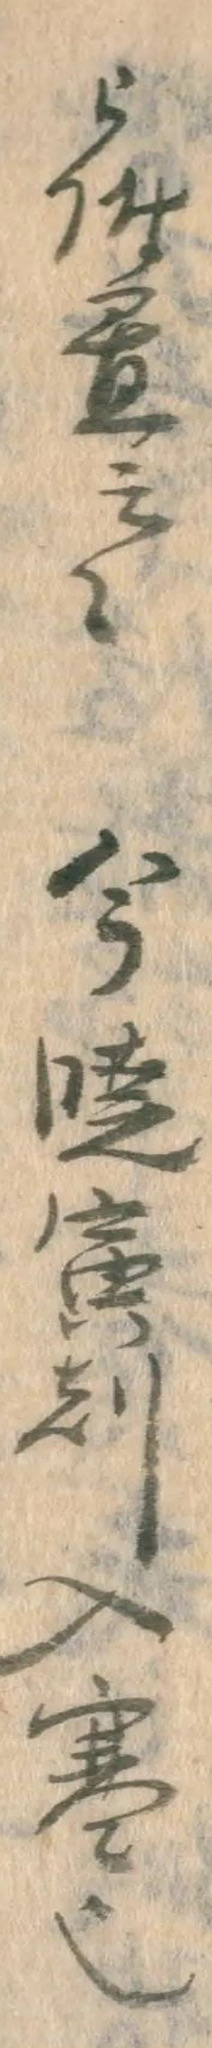被附置云々、今暁寅刻入寒也、
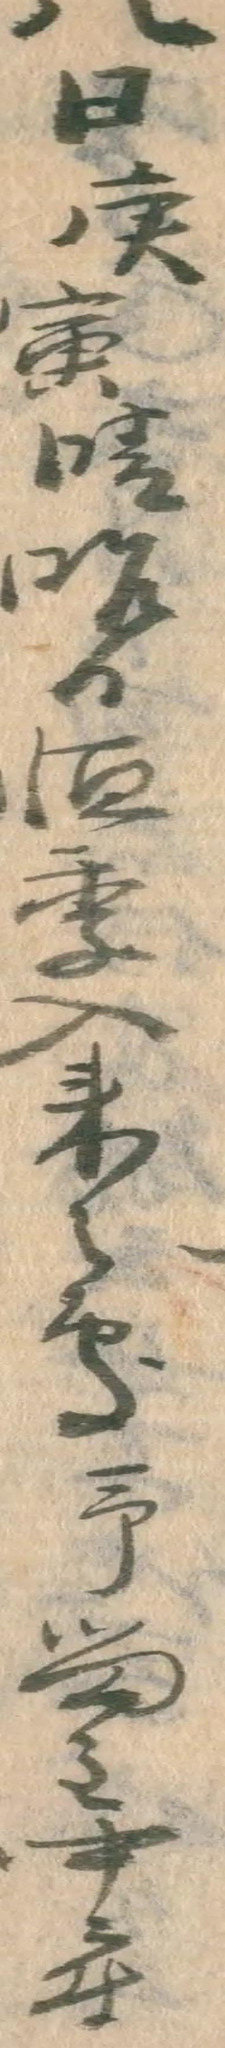八日庚寅晴、昨日恒季入来之處、予留主中ニ付、
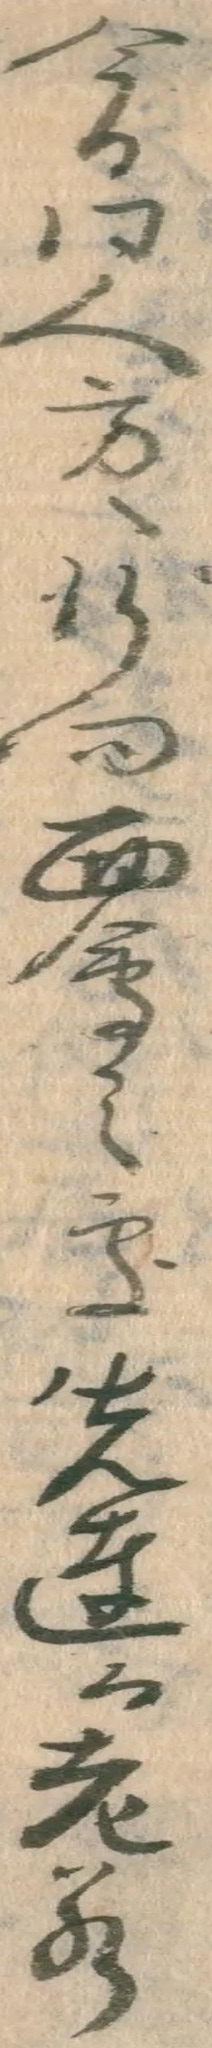今日同人方へ行向面會之處、先達而老若
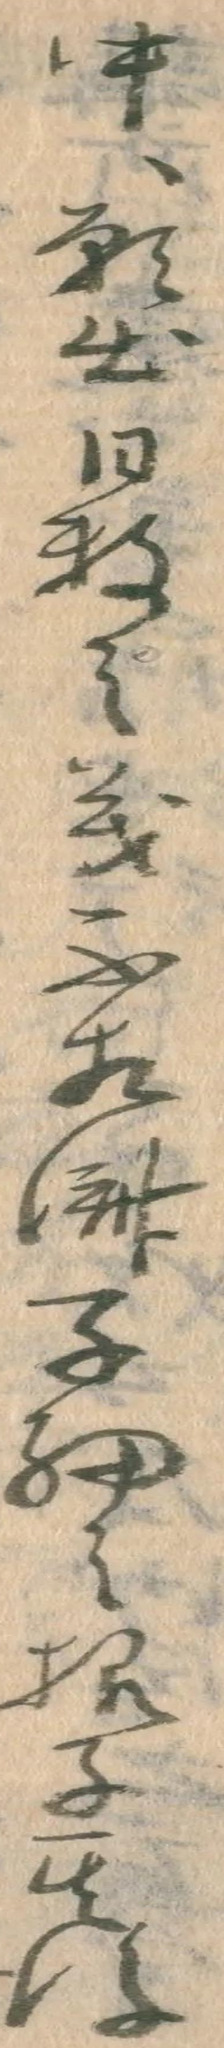中へ願出、日数之義不相済、子細之様子、其後
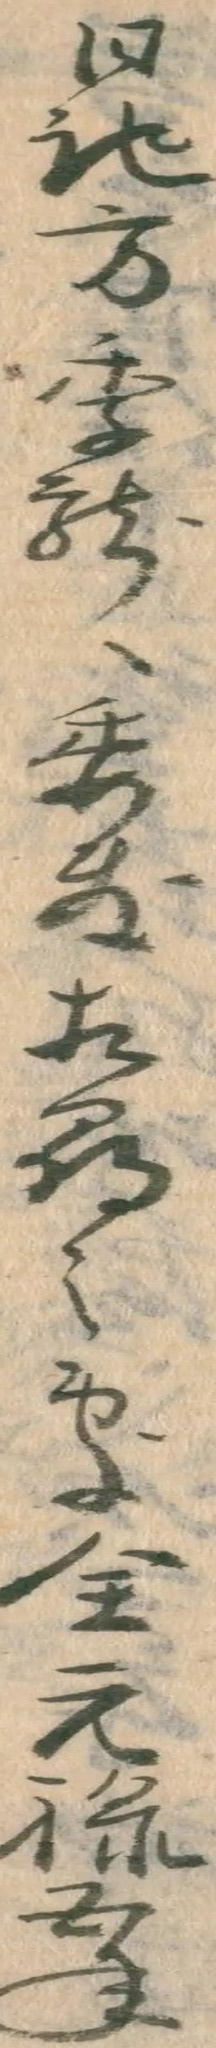日記方季龍へ委敷相尋之處、全元禄五年
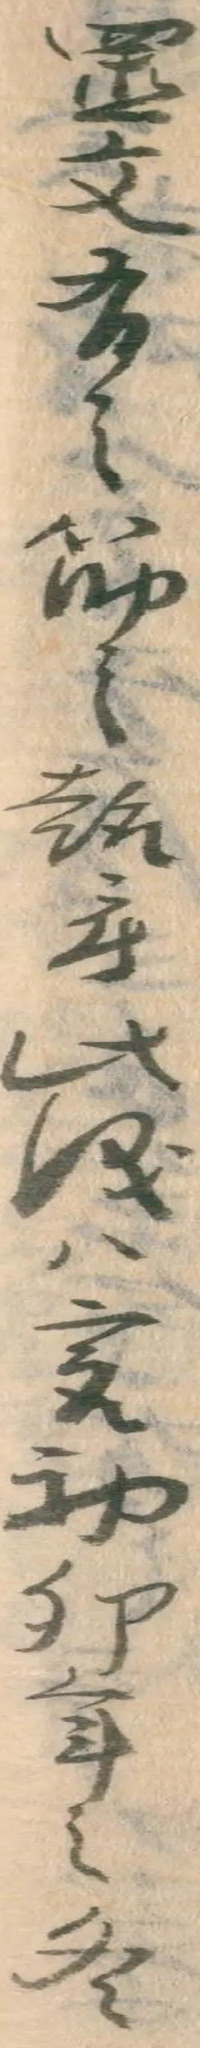置文有之筋之趣ニ付、此儀ハ最初卯年之冬
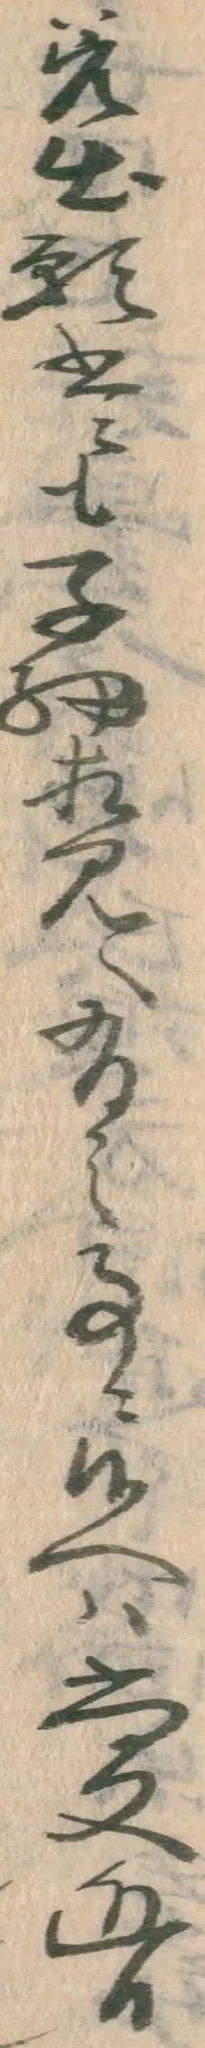差出願書ニも子細相見へ有之事ニ候へハ、尚又近日
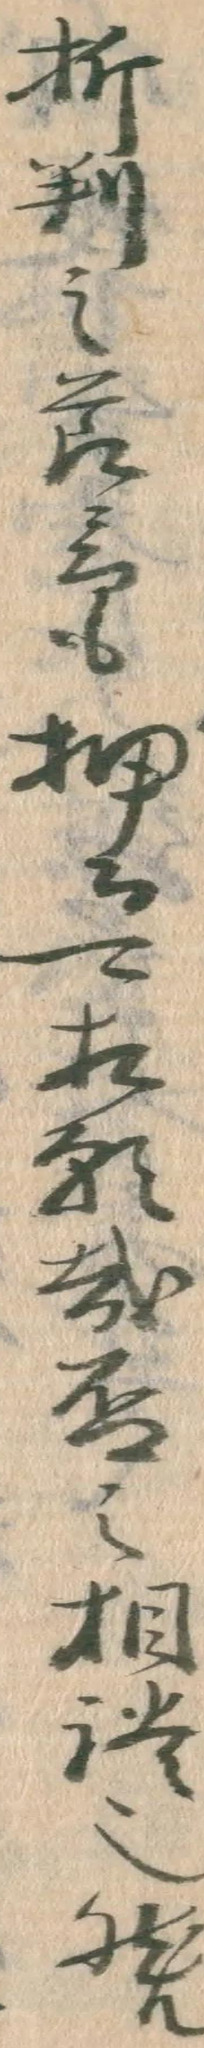折判之節ニ而も押而可相願哉否之相談也、然ル
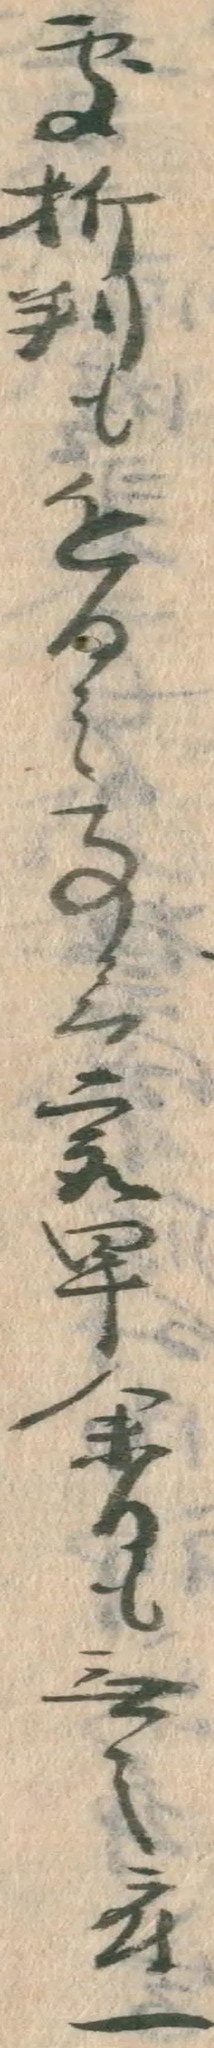處、折判も近日之事ニ而、最早余日も無之ニ付、一
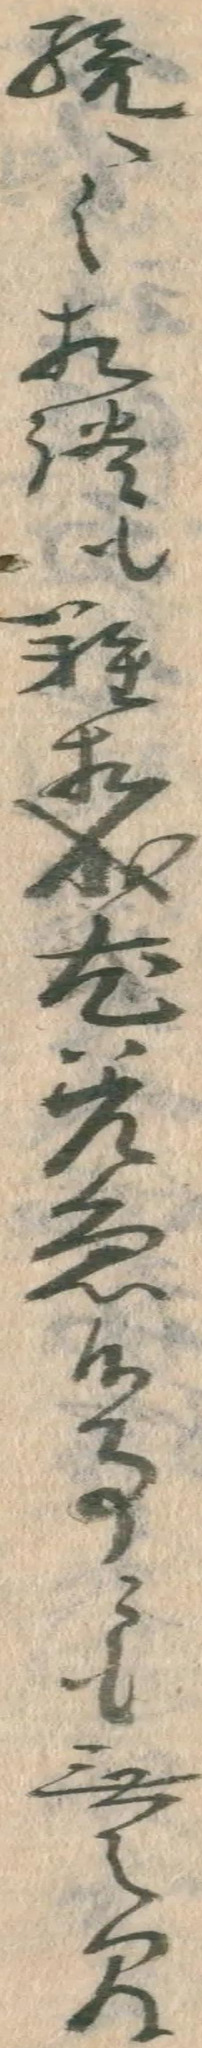統へ之相談も難相成、尤差急候事ニも無之間、
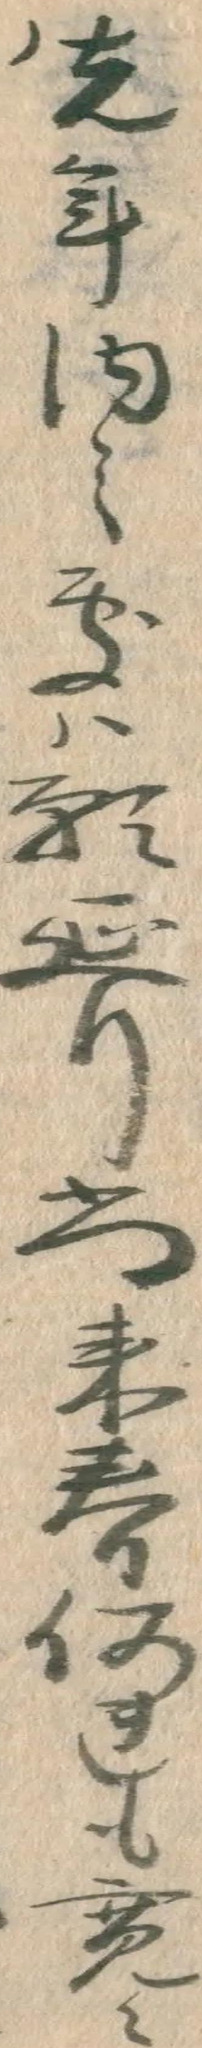先年内之處ハ願延行、尚来春何れも寛々
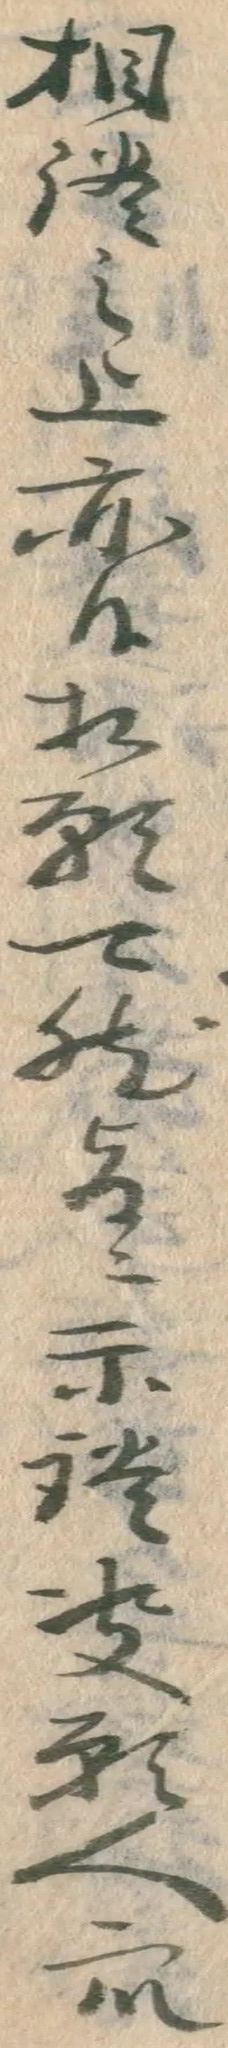相談之上、亦候相願可然旨ニ示談決、願人衆
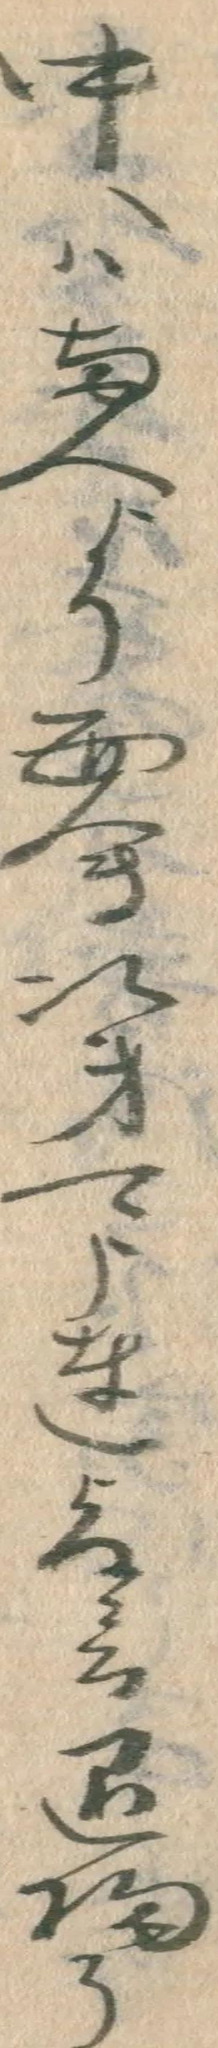中ヘハ両人より面會次第可申達旨ニ而退帰了、
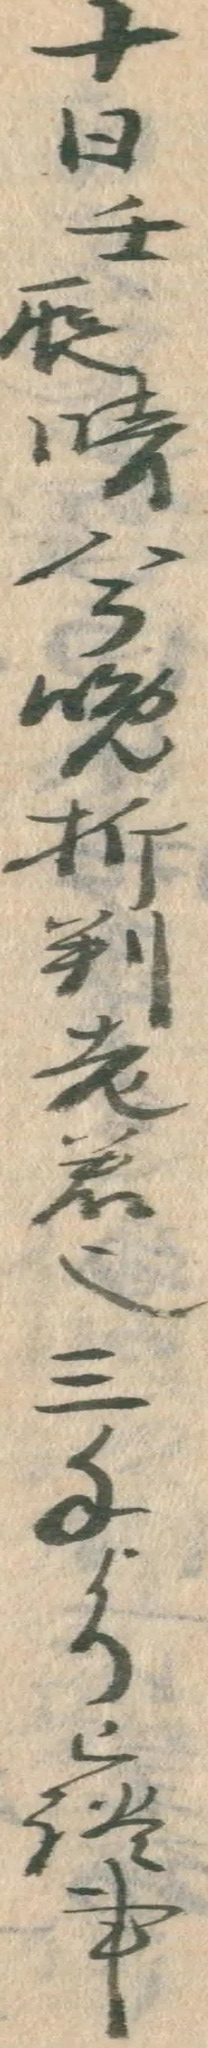十日壬辰晴、今晩折判老若也、三手より被談事
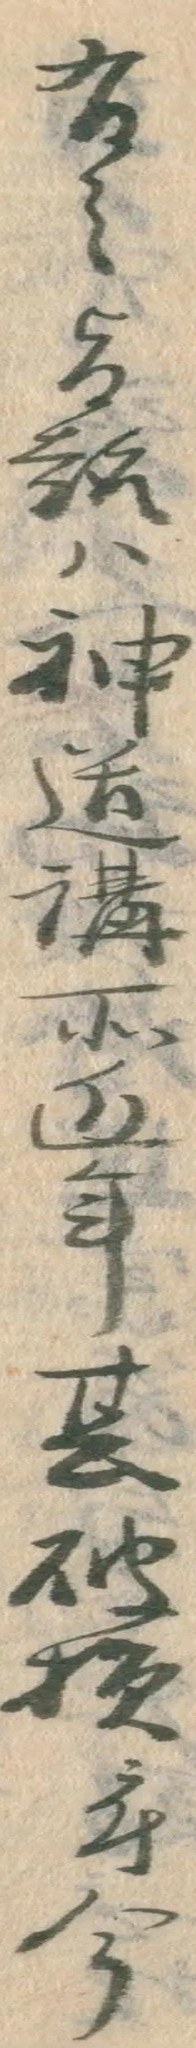有之、旨趣ハ神道講所、近年甚破損ニ付、今
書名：賀茂社記録. 第63冊
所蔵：国立国会図書館 National Diet Library, JAPAN
